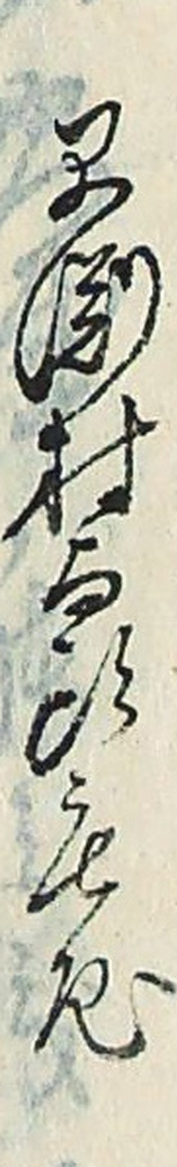早渕村与頭庄屋
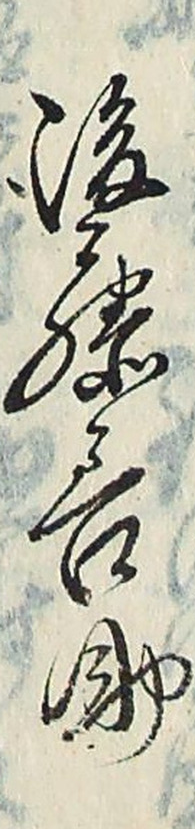後藤善助
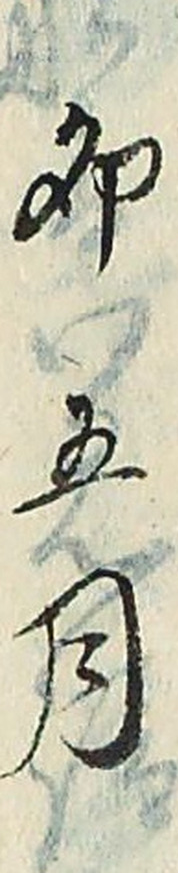卯五月
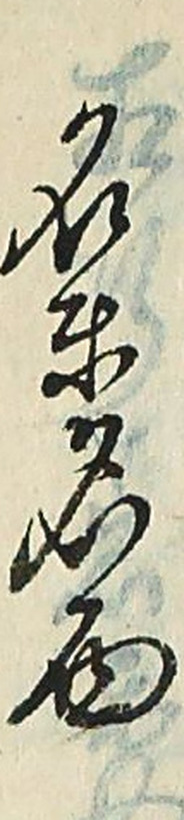名東名西
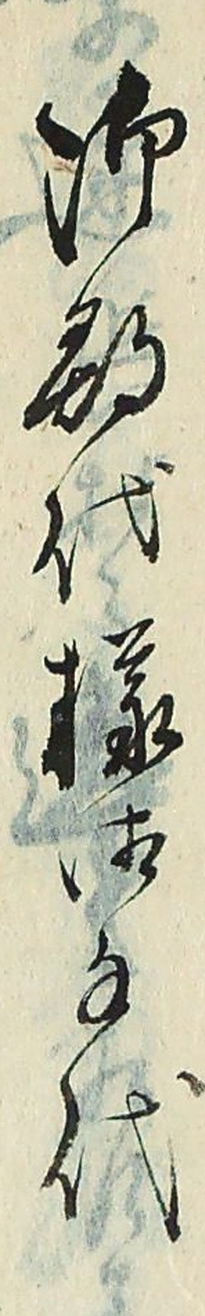御郡代様御手代
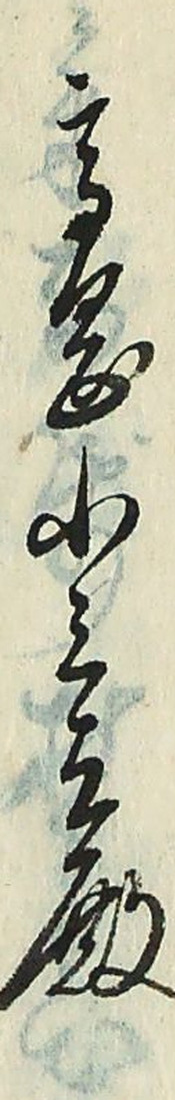高岡小三太殿

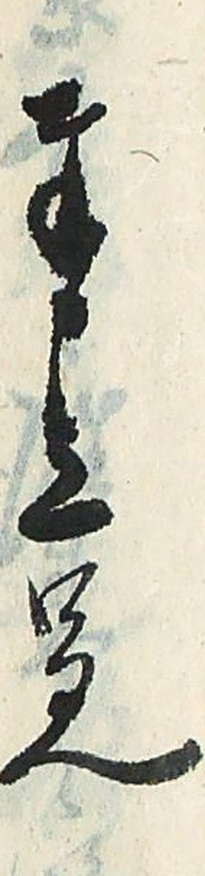奉申上覚
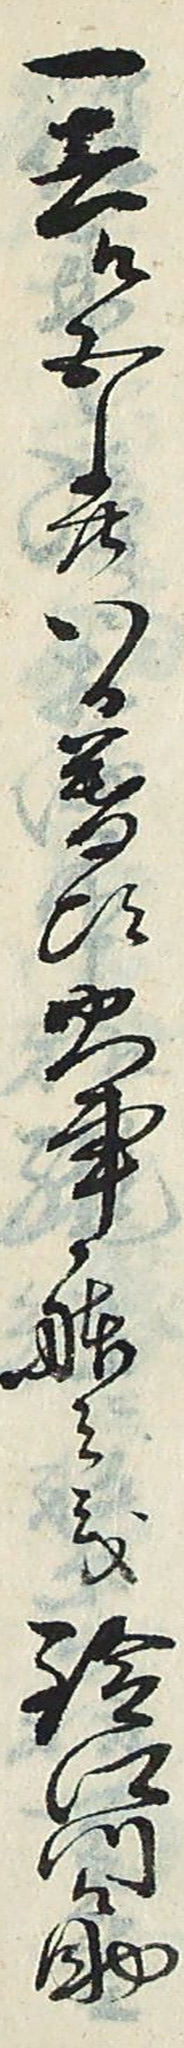一去ル五月廿八日暮頃火事躰之義鈴江川筋
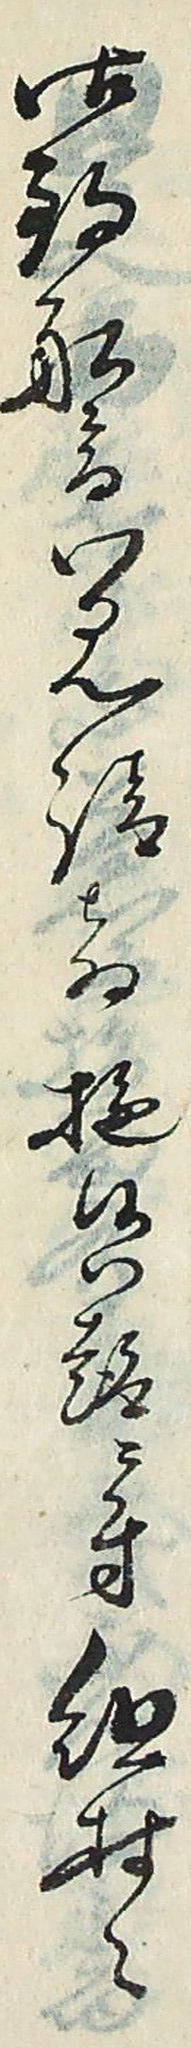御釣船に而御見請被為遊候御趣に付組村々
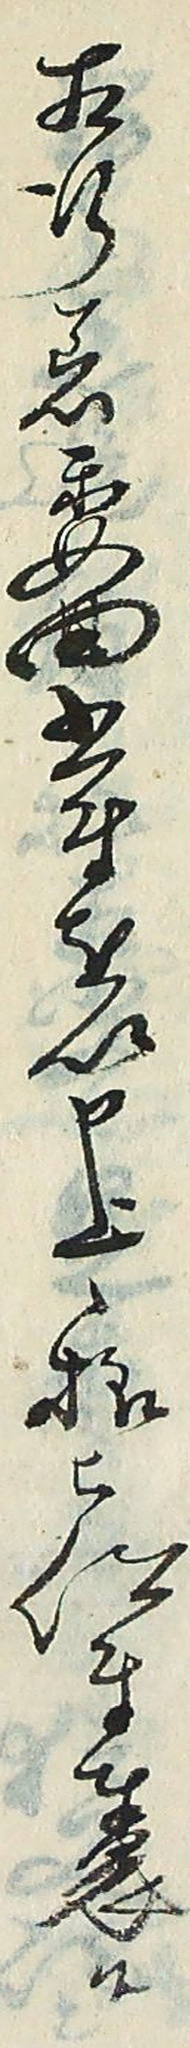相行着委曲書付を以申上候様被仰付奉畏候
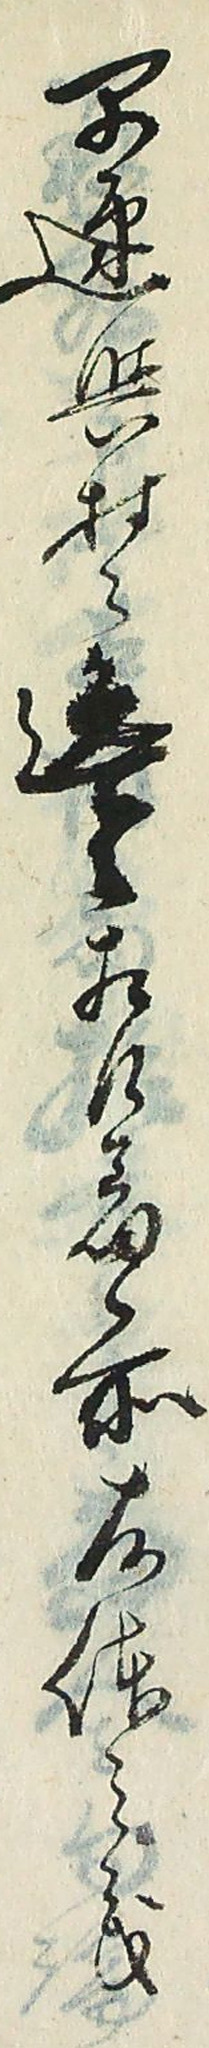早速与村々逸々相行着候所右体之義
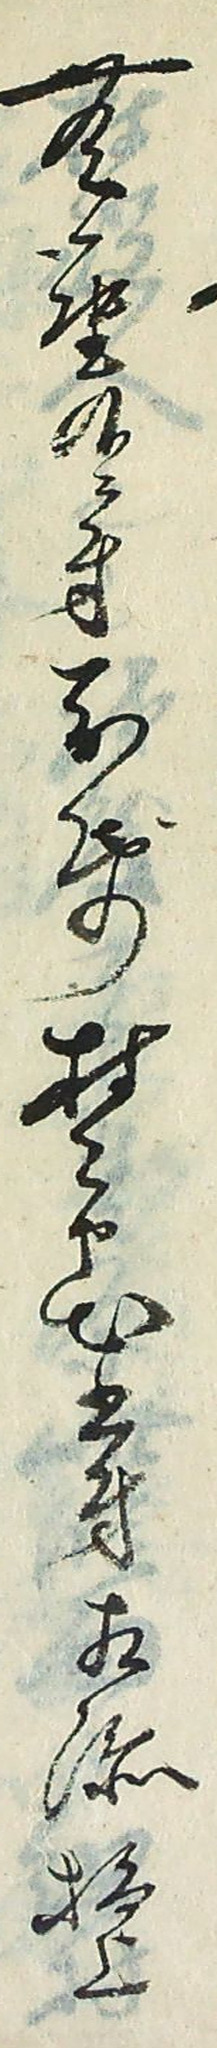無御坐候に付別帋村々申出書付相添指上
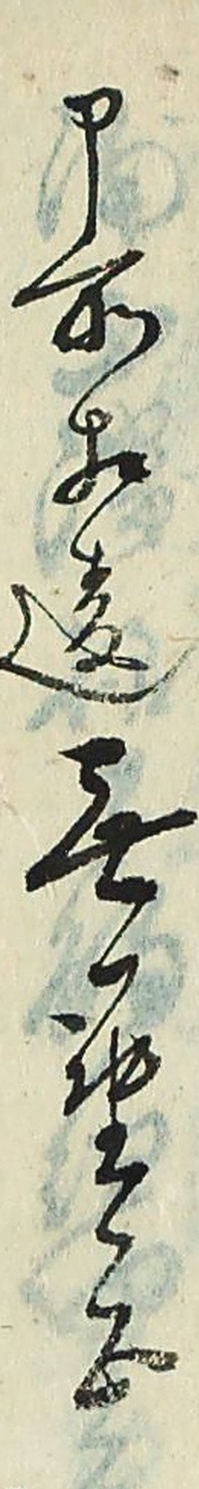申所相違無御坐候以上
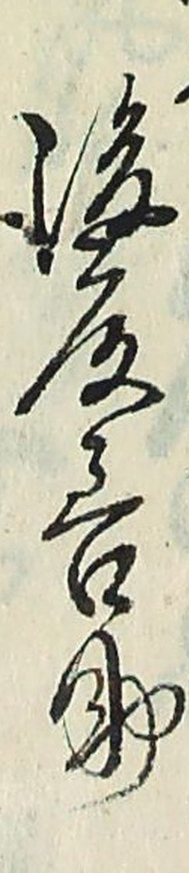後藤善助
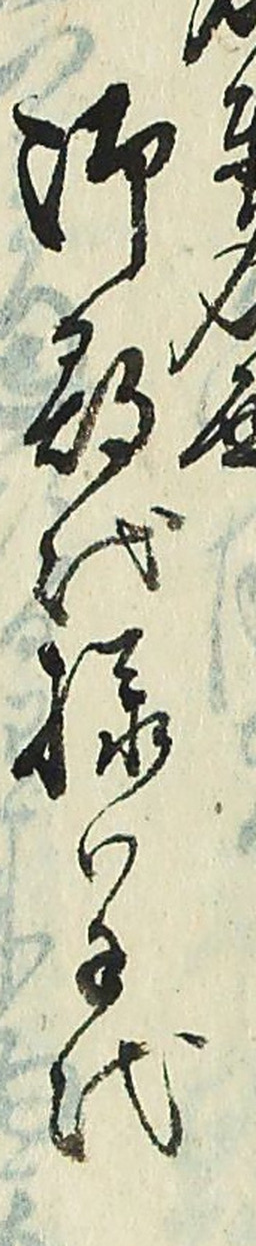御郡代様御手代
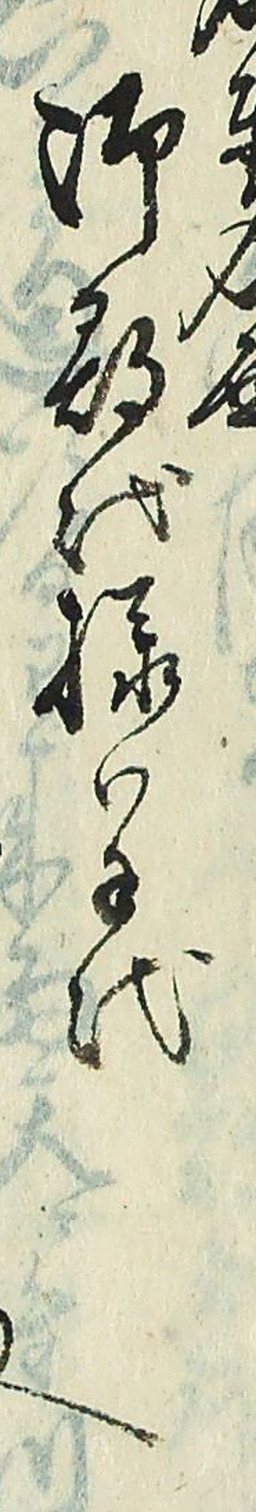御郡代様御手代
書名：諸御用御□受書控
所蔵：鳴門教育大学 Naruto University of Education
